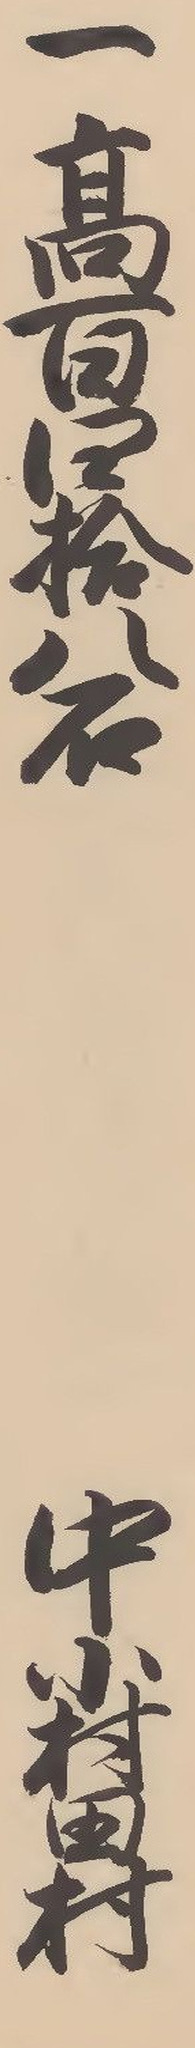一高百四拾八石中小村田村
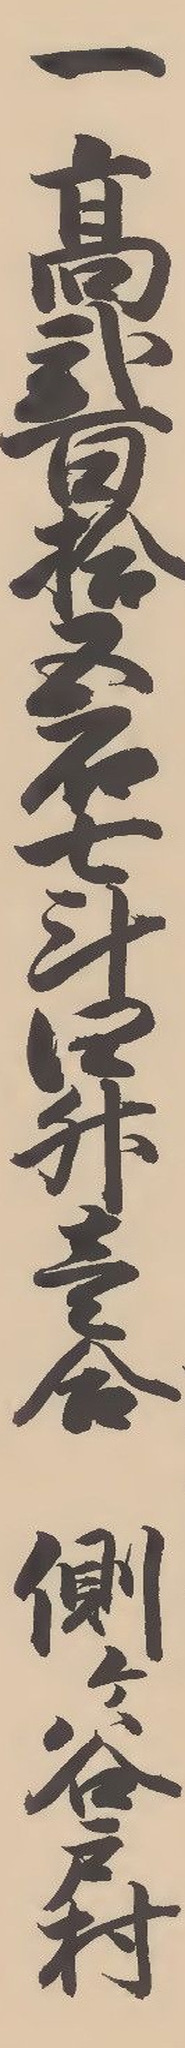一高弐百拾五石七斗四升壱合側ヶ谷戸村
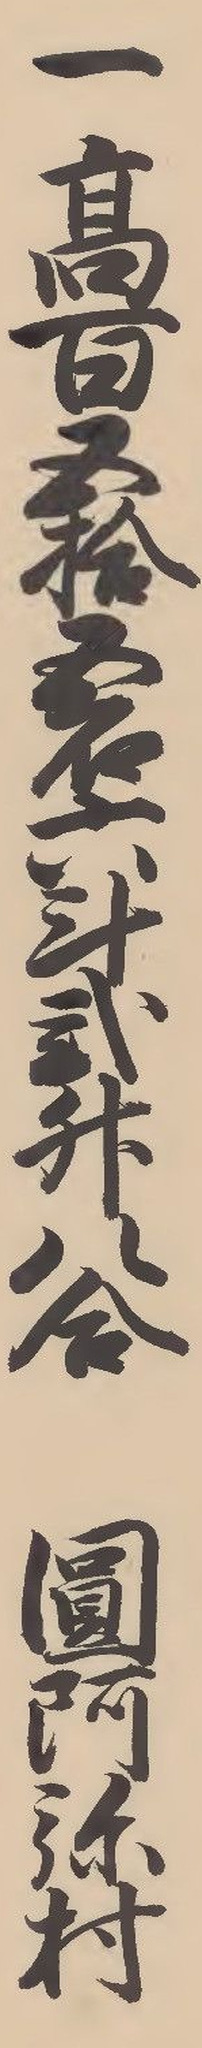一高百五拾五石六斗弐升八合円阿弥村
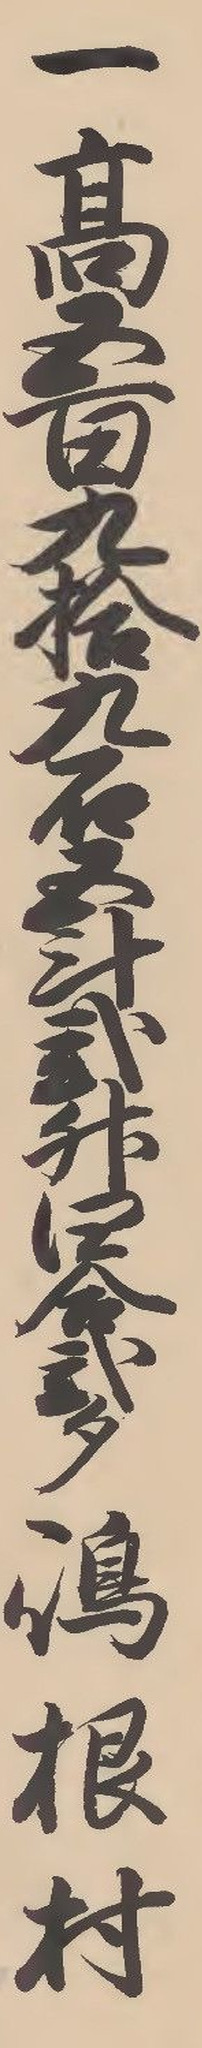一高五百九拾九石五斗弐升四合弐勺嶋根村
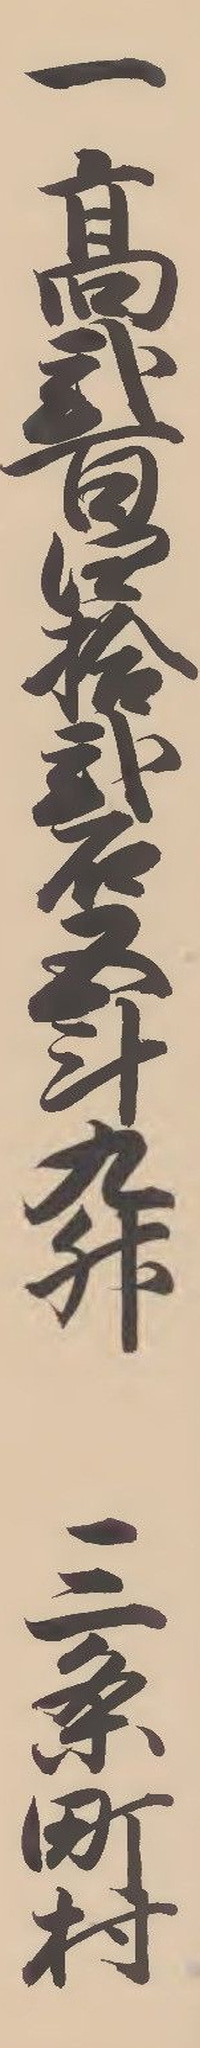一高弐百四拾弐石五斗九升三条町村
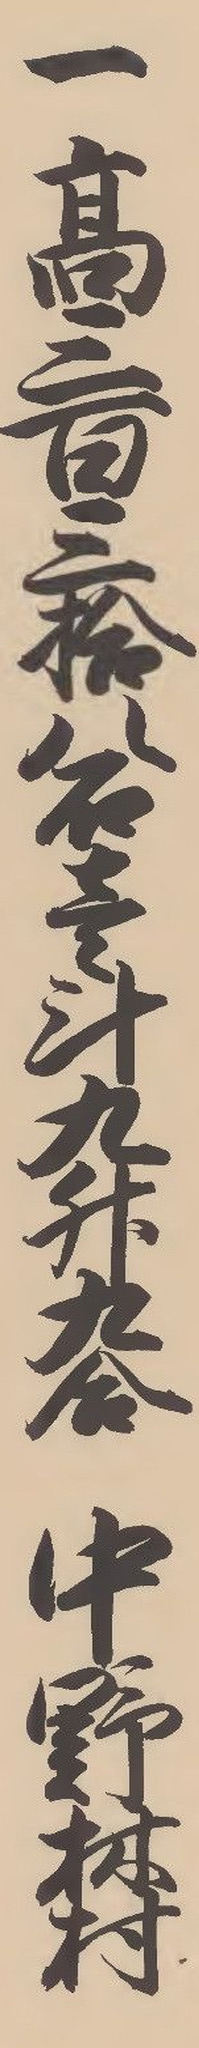一高三百三拾八石壱斗九升九合中野林村
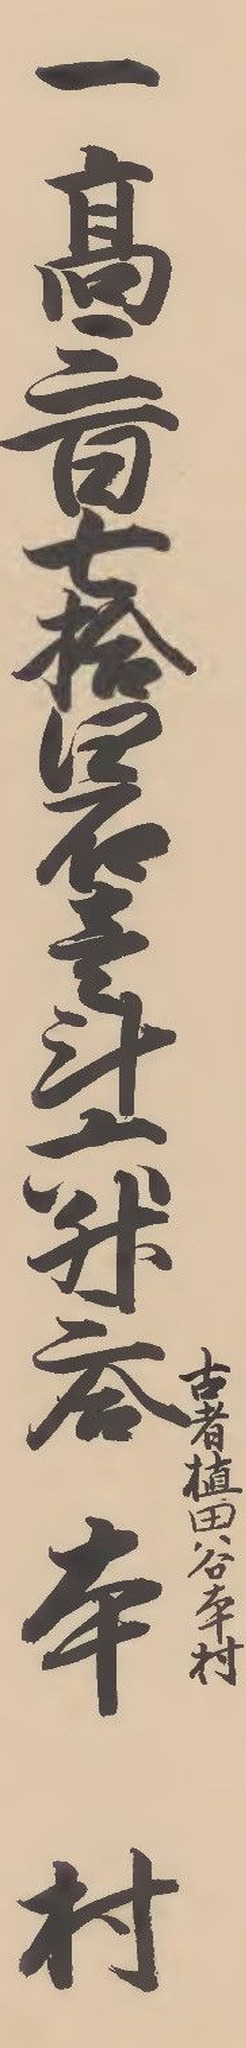一高三百七拾四石壱斗六升三合本村
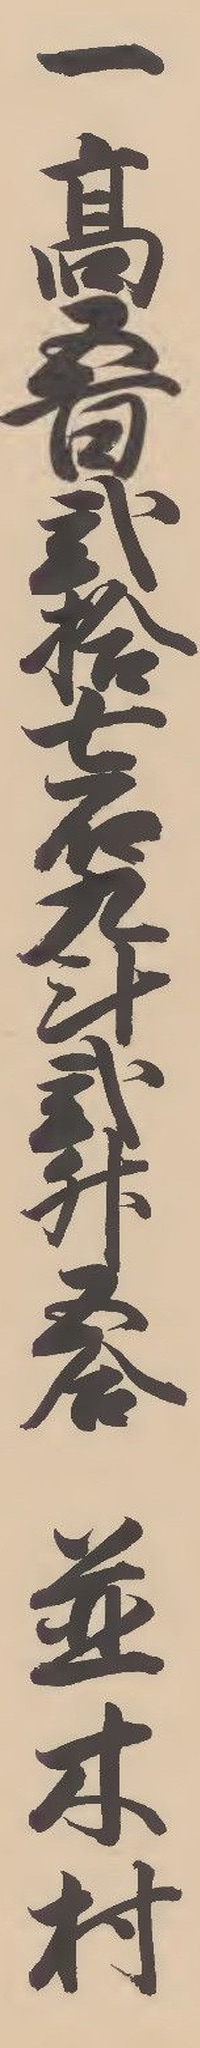一高五百弐拾七石九斗弐升五合並木村

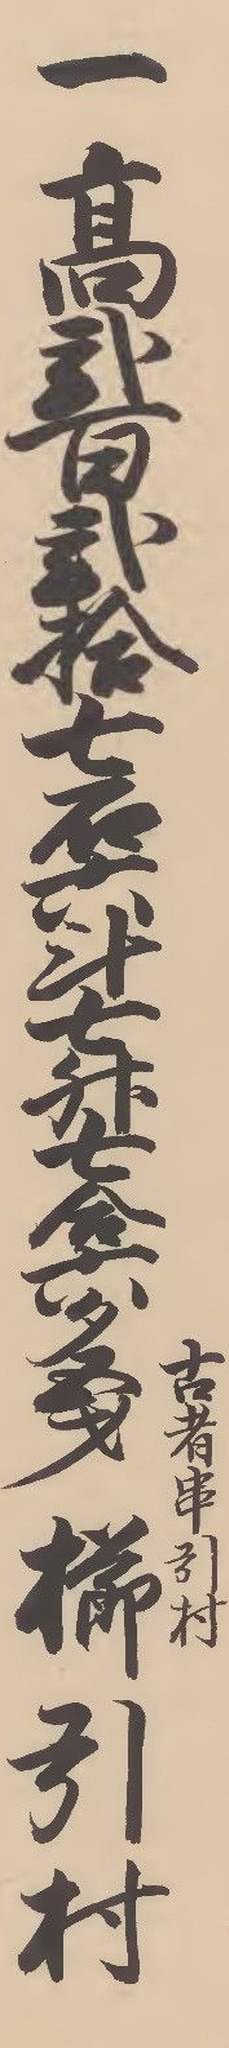一高弐百弐拾七石六斗七升七合六勺五才櫛引村
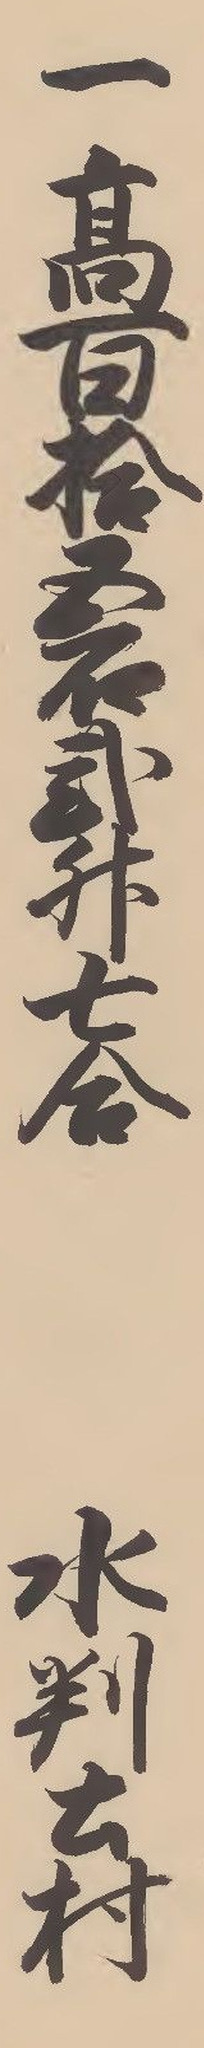一高百拾五石弐升七合水判土村
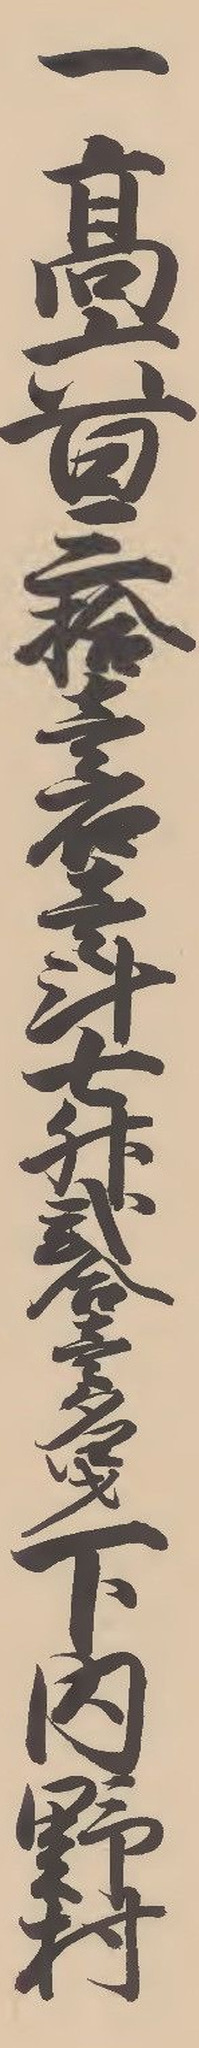一高六百三拾壱石壱斗七升弐合壱勺四才下内野村
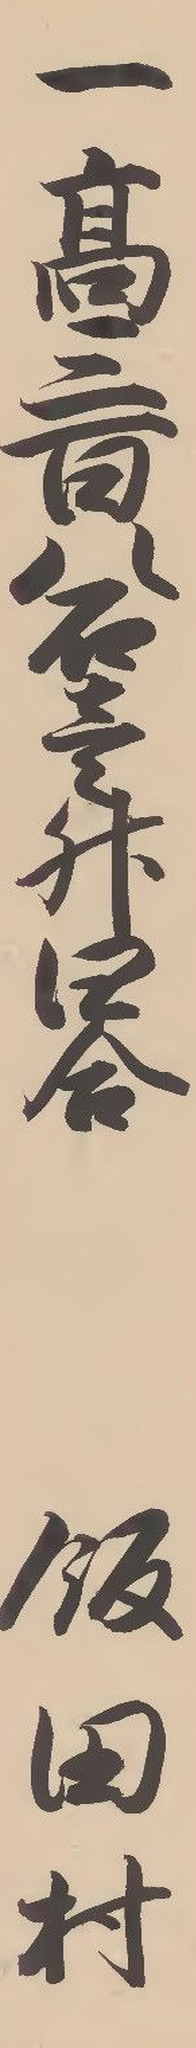一高三百八石壱升四合飯田村
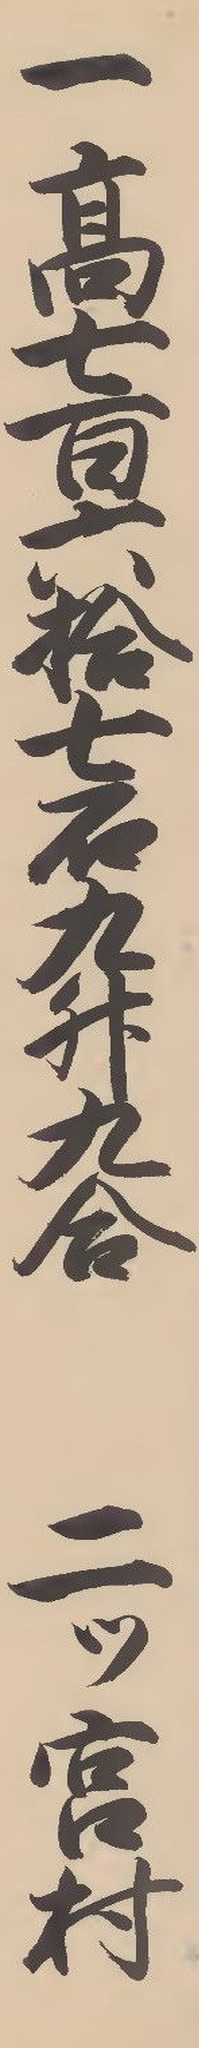一高七百六拾七石九升九合二ッ宮村
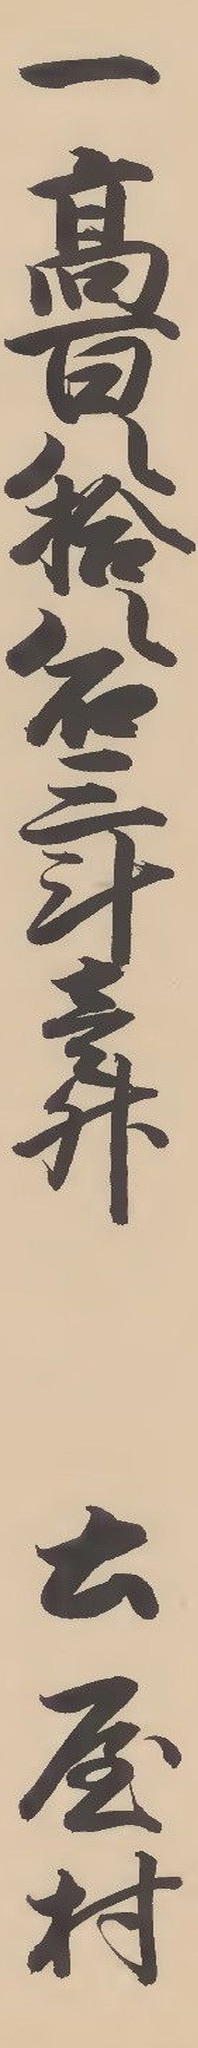一高百八拾八石三斗壱升土屋村
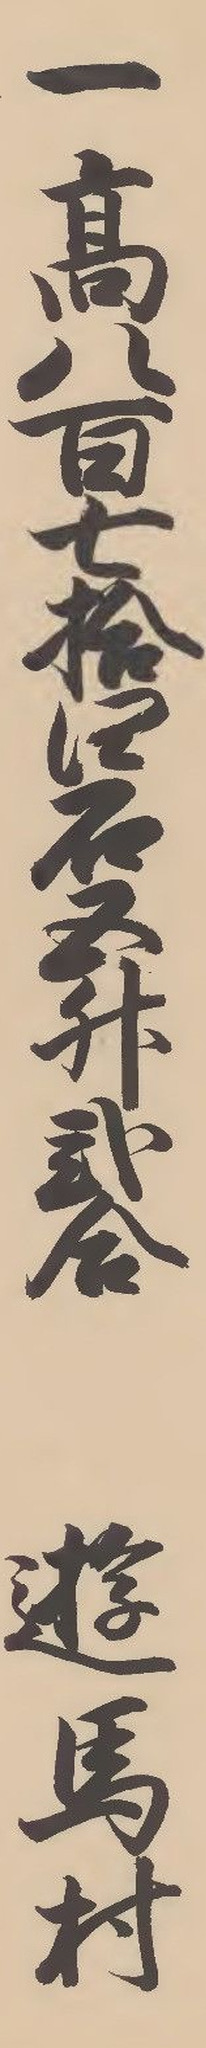一高八百七拾四石五升弐合遊馬村
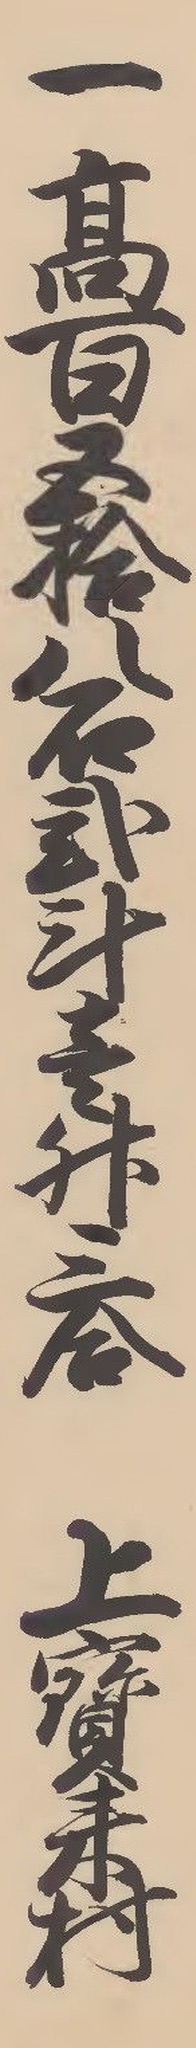一高百五拾八石弐斗壱升三合上宝来村
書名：武蔵国郷帳　下
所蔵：国立公文書館 National Archives of Japan
